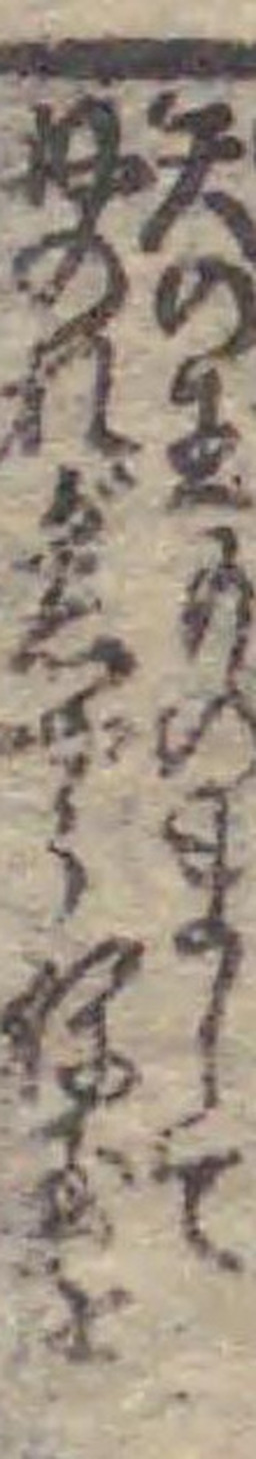おのれがしやうね玉を
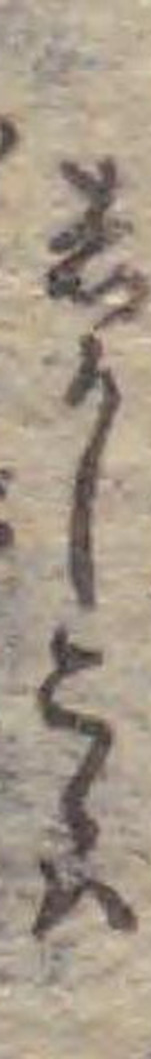しかしこゝは
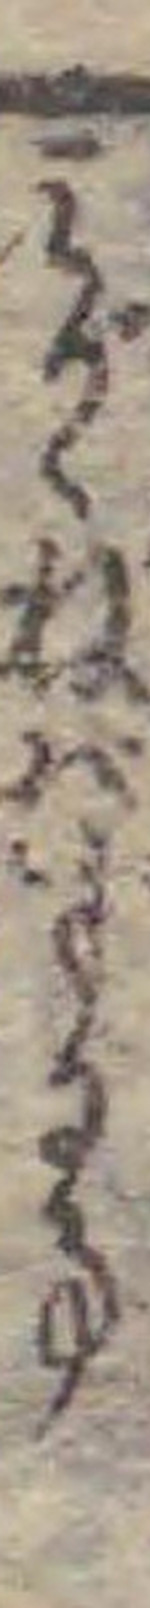みがゝねばする事
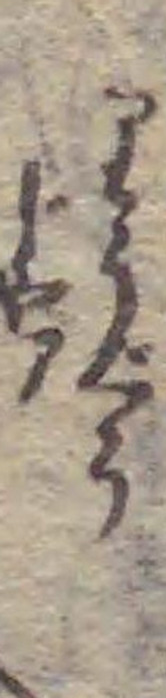りうぐう
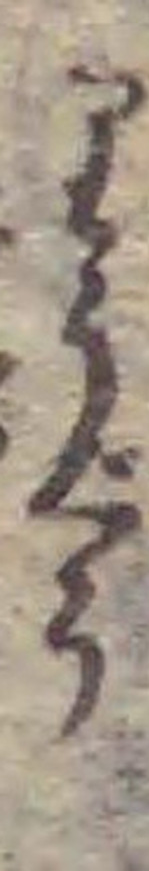りうぐう
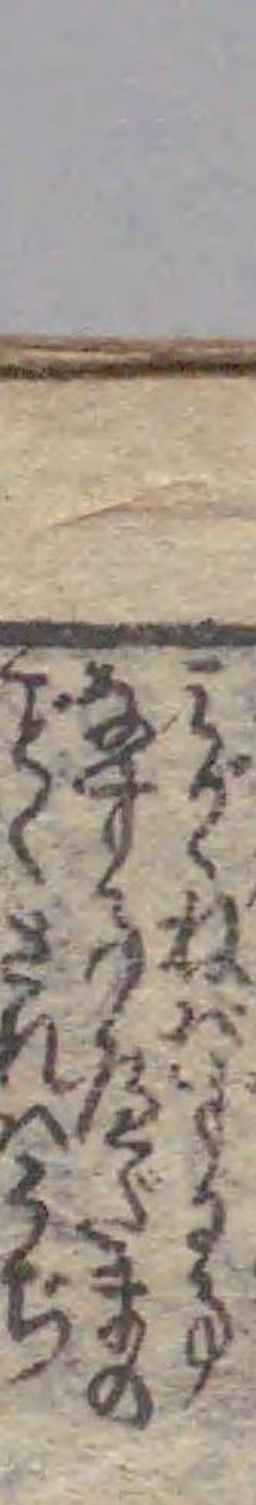なす事へだまの
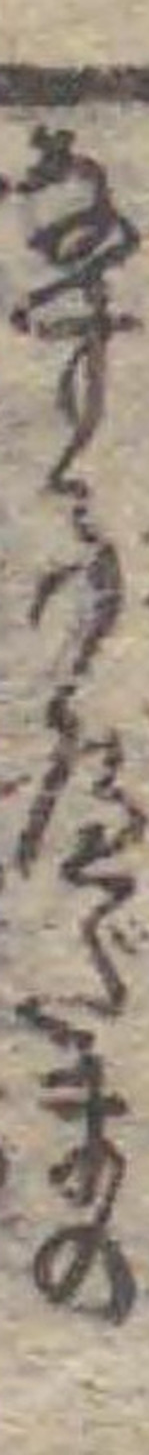なす事へだまの
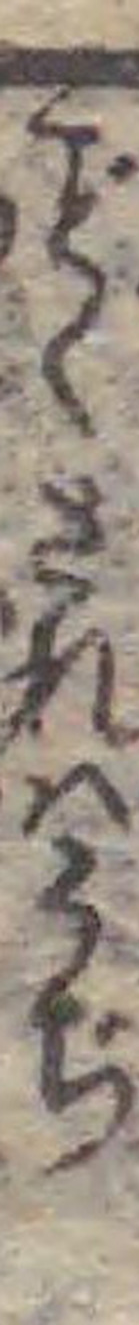ごとくさ？れはうぢ
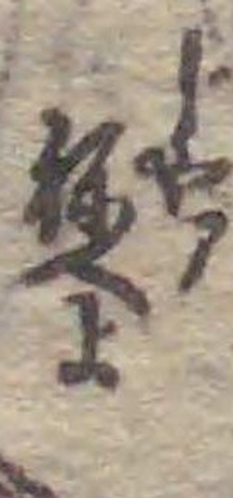ねえよ
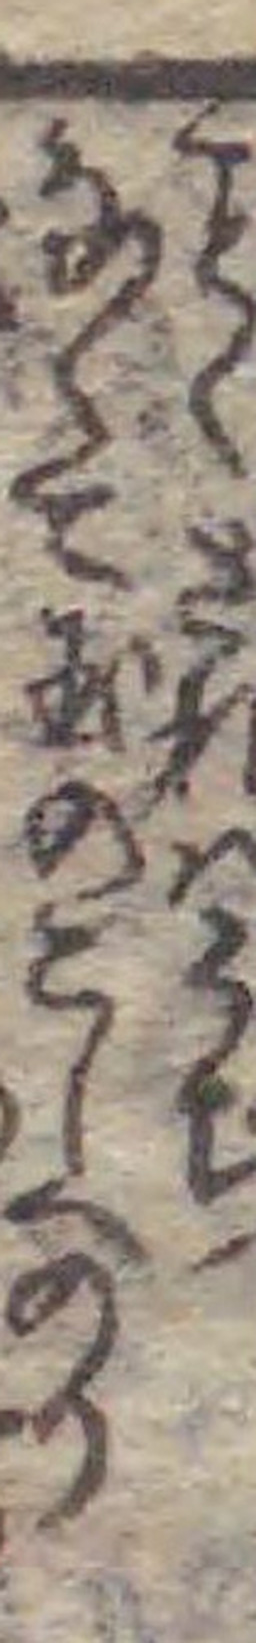なくて玉のこしへのり
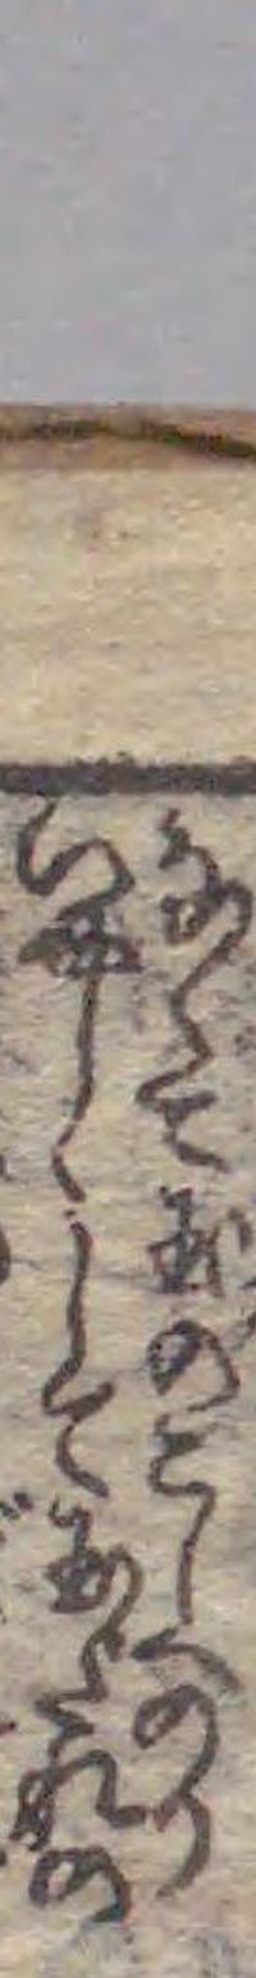いやしくして玉だれの
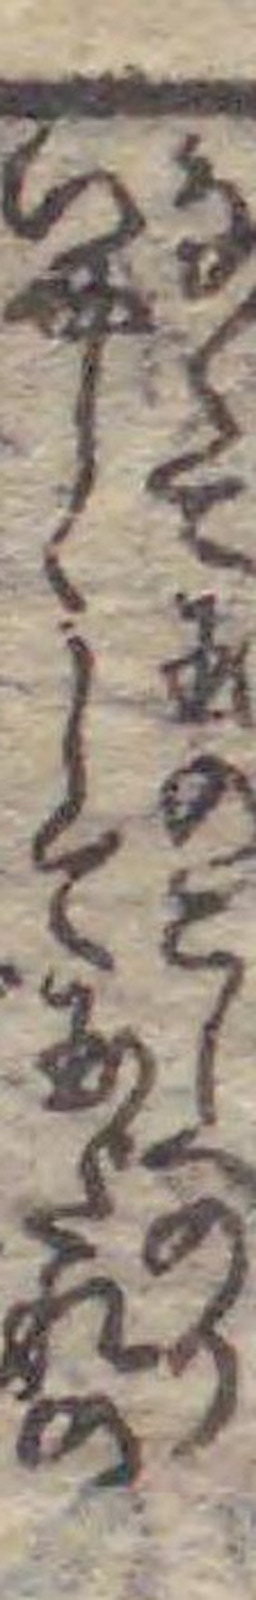いやしくして玉だれの
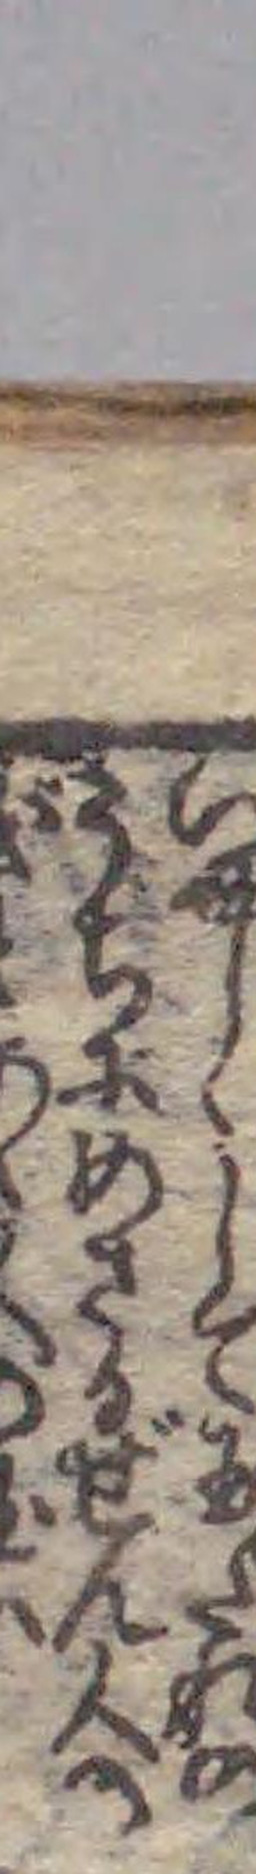うちにめさるぜん人の
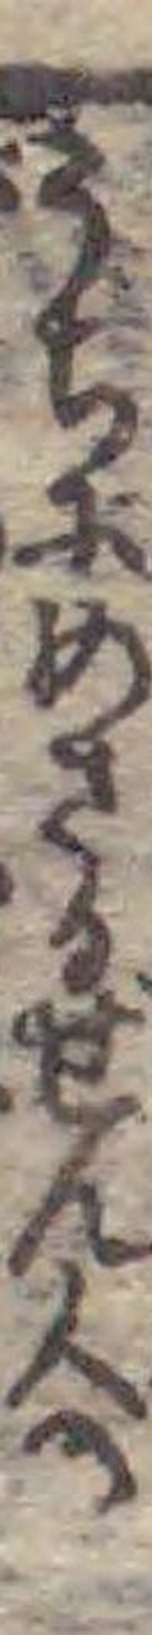うちにめさるぜん人の
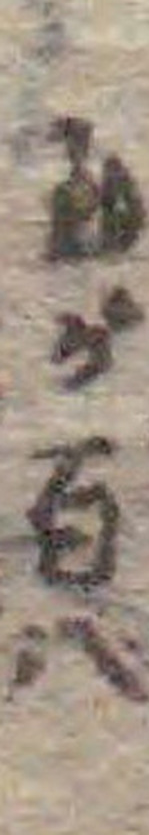玉が百八
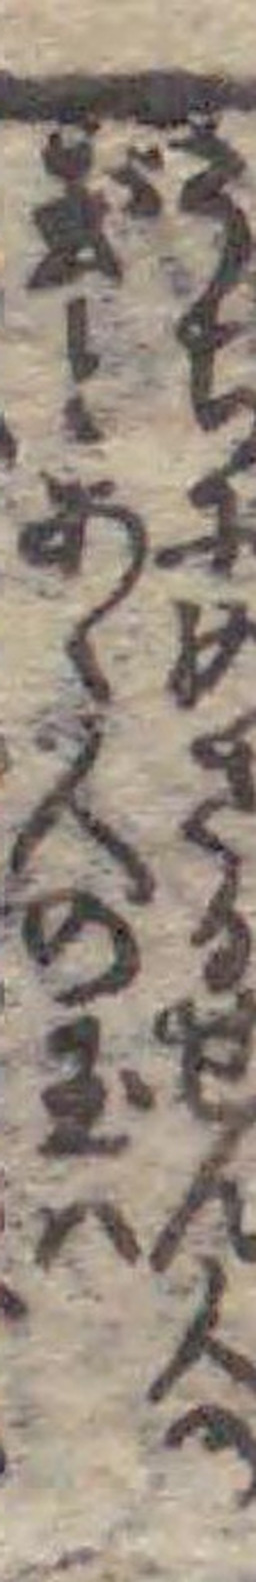玉とあく人の玉は
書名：四遍搨心学草帋 : 3巻
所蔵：国立国会図書館 National Diet Library, JAPAN
